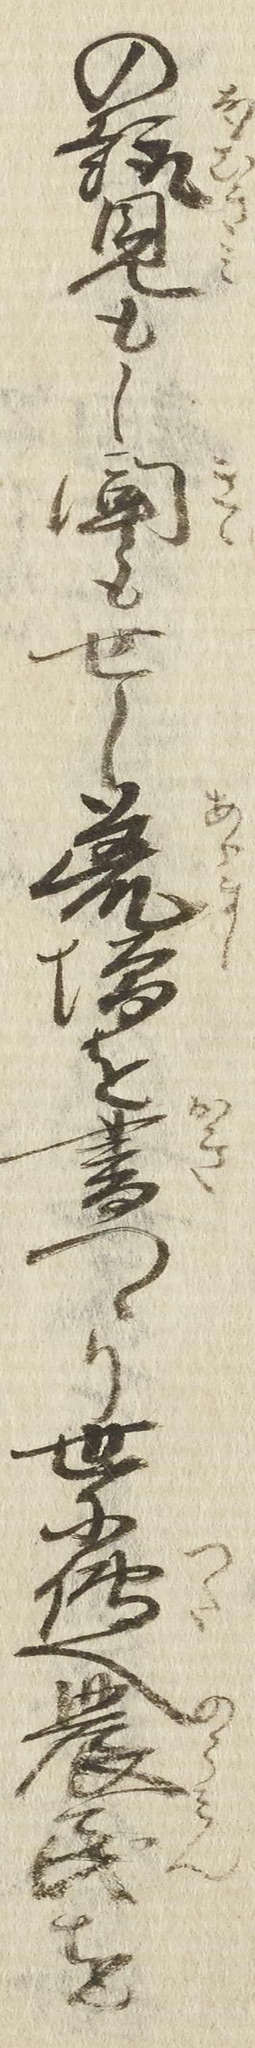の趣見もし聞もせし荒増を書つゝり世に伝へ農民を
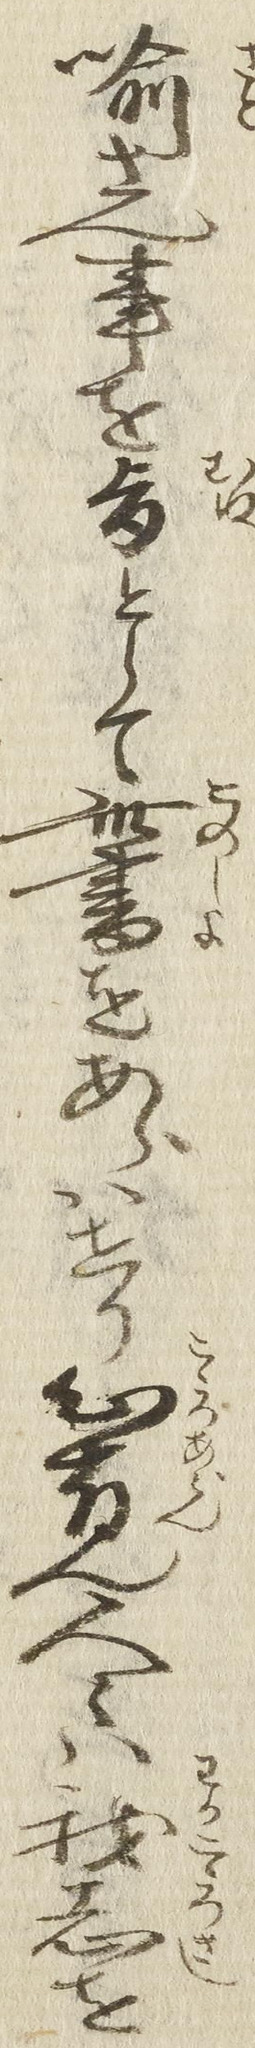諭さん事を旨として此書をあらはせり心有ん人〻は我志を
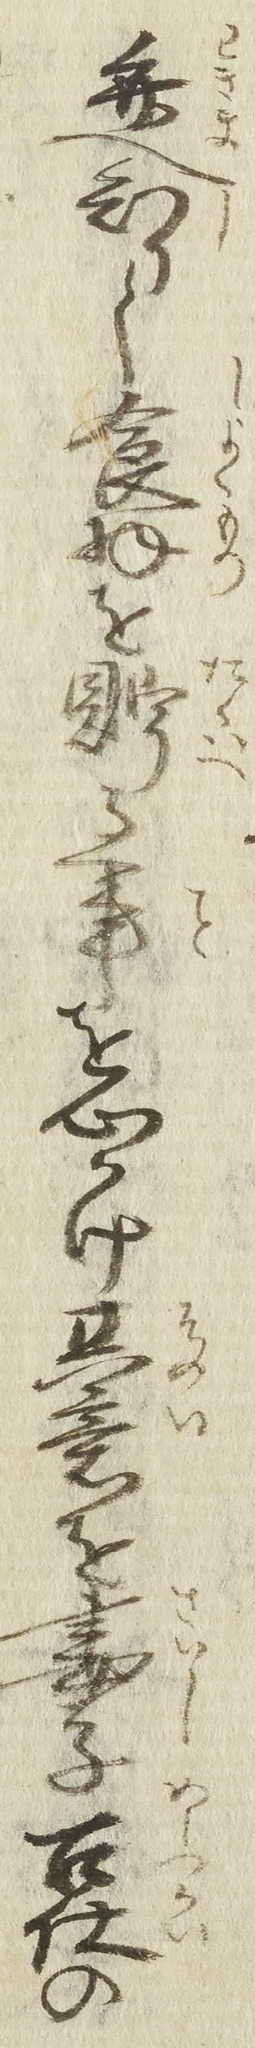弁へ知りて食物を貯る事を心かけ其意を妻子召仕の
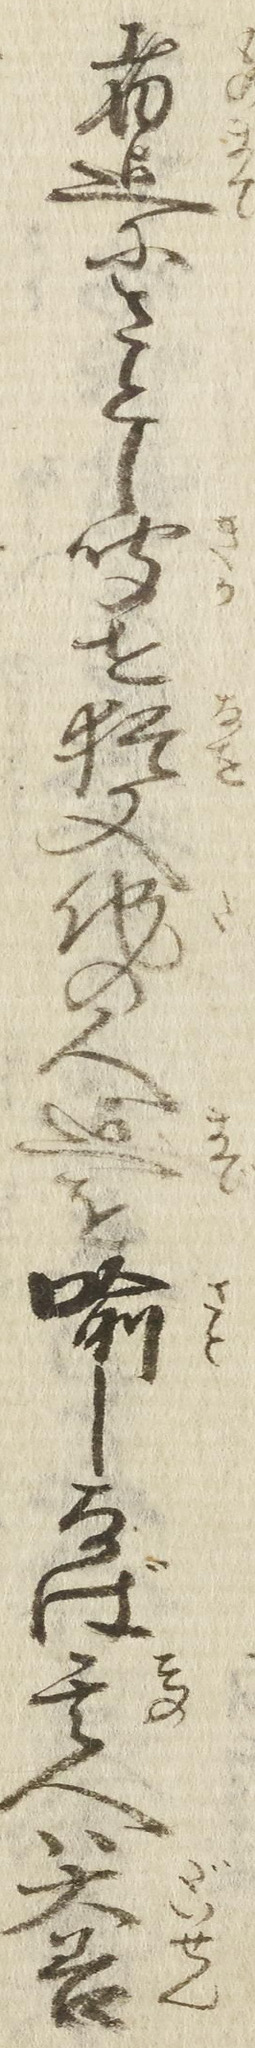者迄にさとし聞せ猶又他の人迄を諭しなば其人は大善
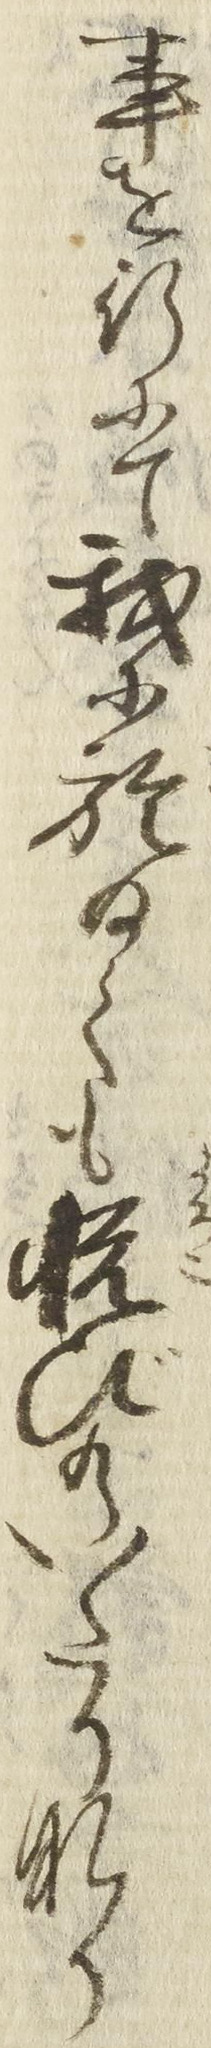事を行ふて我に於ゐても悦びのいたりなり
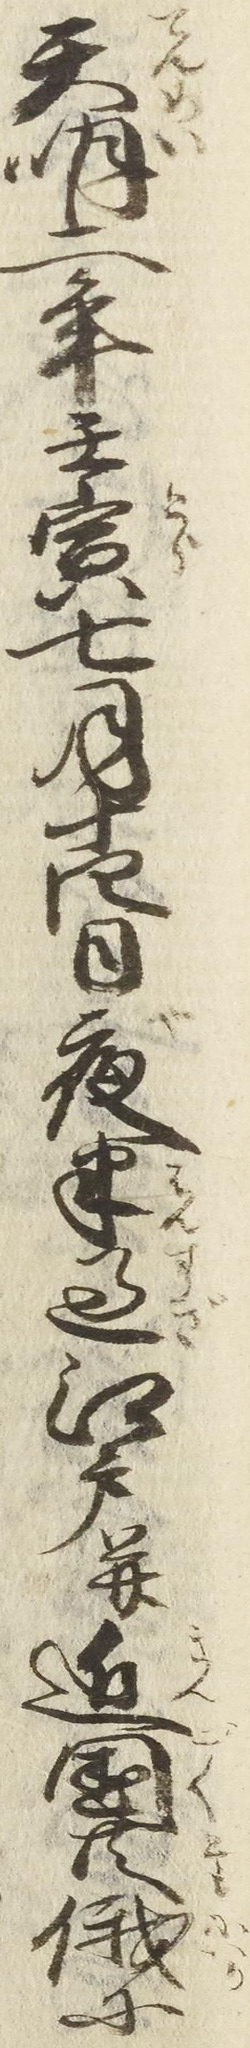天明二年壬寅七月十四日夜半過江戸并近国共俄に
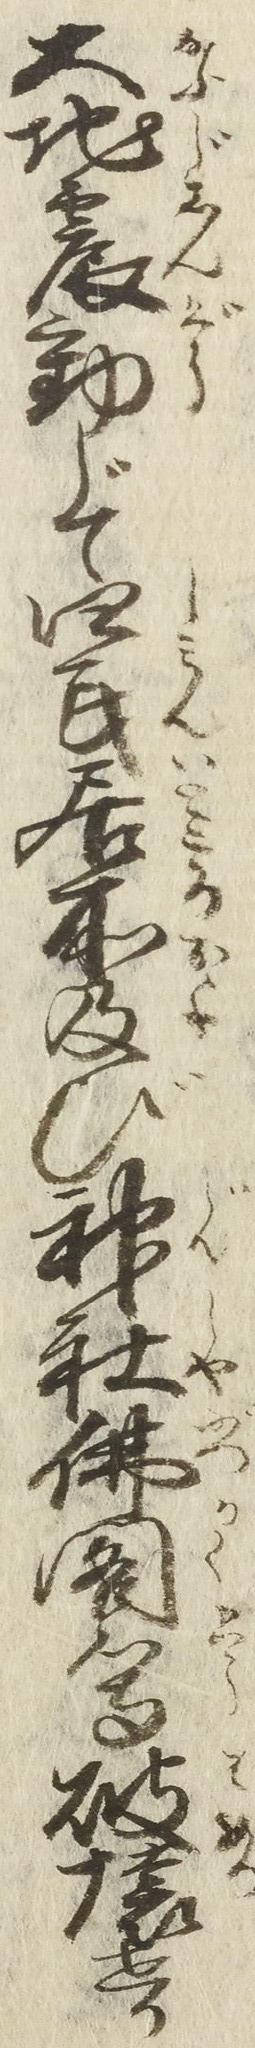大地震動じて四民居所及び神社仏閣等破壊せり
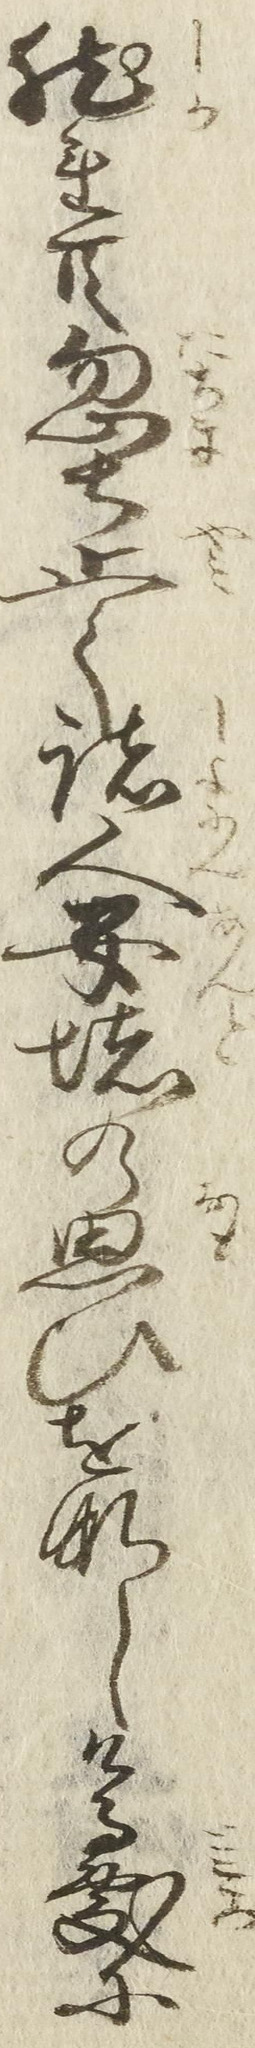然れ共忽ち止て諸人安堵の思ひをなしける処に
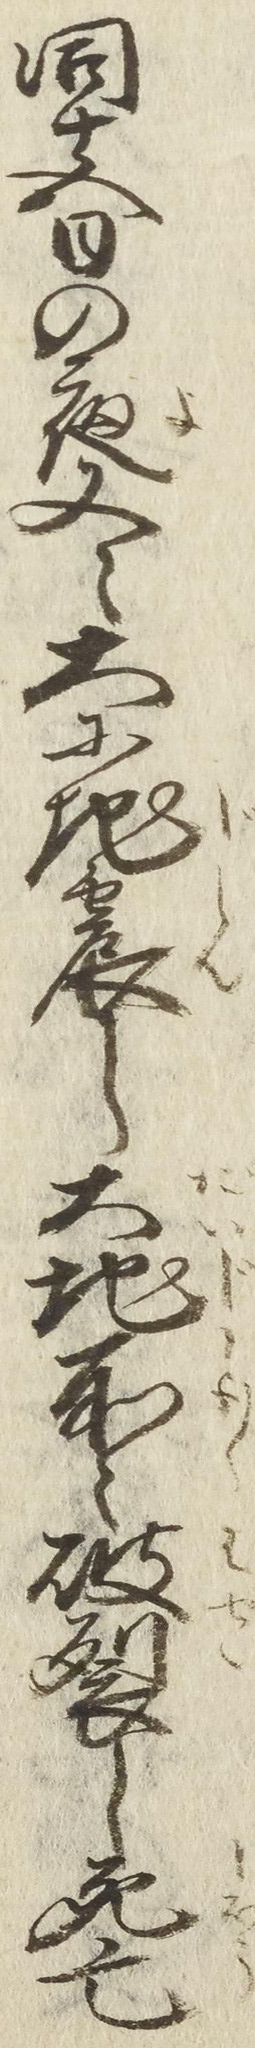同十五日の夜又〻大に地震し大地所〻破裂し死亡
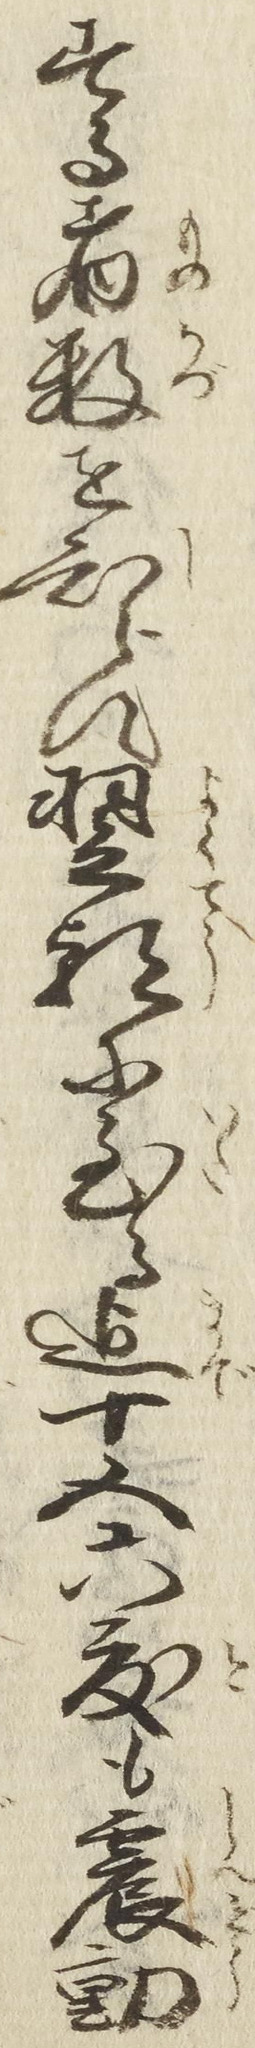する者数を知らす翌朝に至る迄十五六度も震動
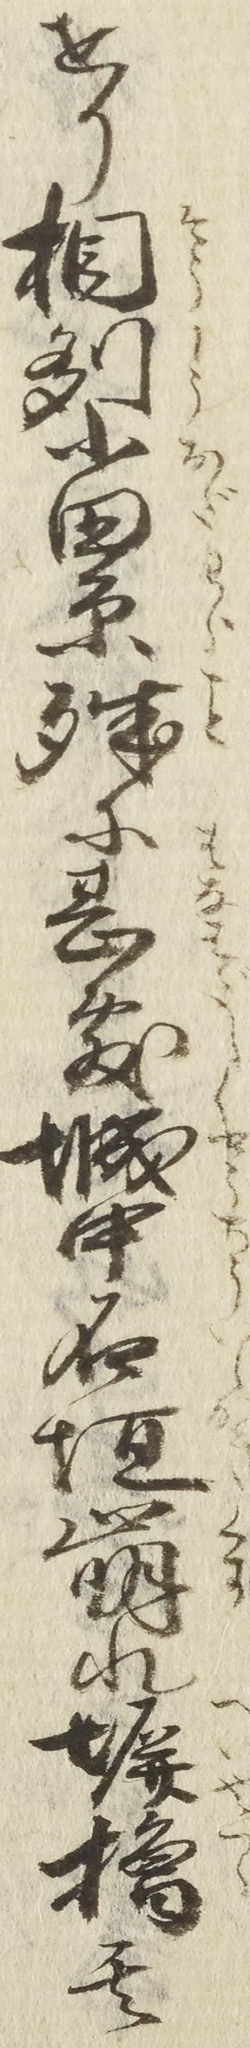せり相州小田原殊に甚敷城中石垣崩れ塀櫓其
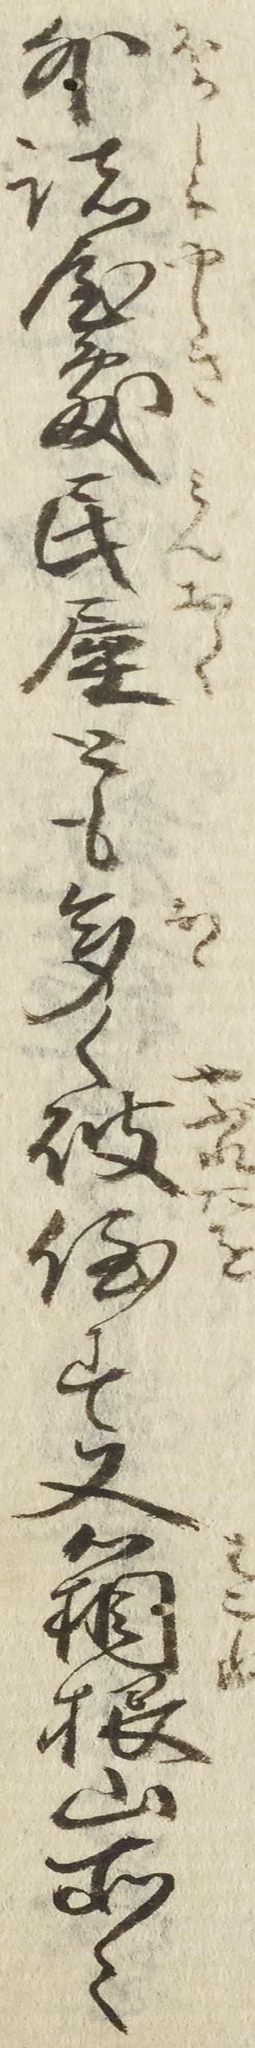外諸屋敷民屋とも多く破倒す又箱根山所〻
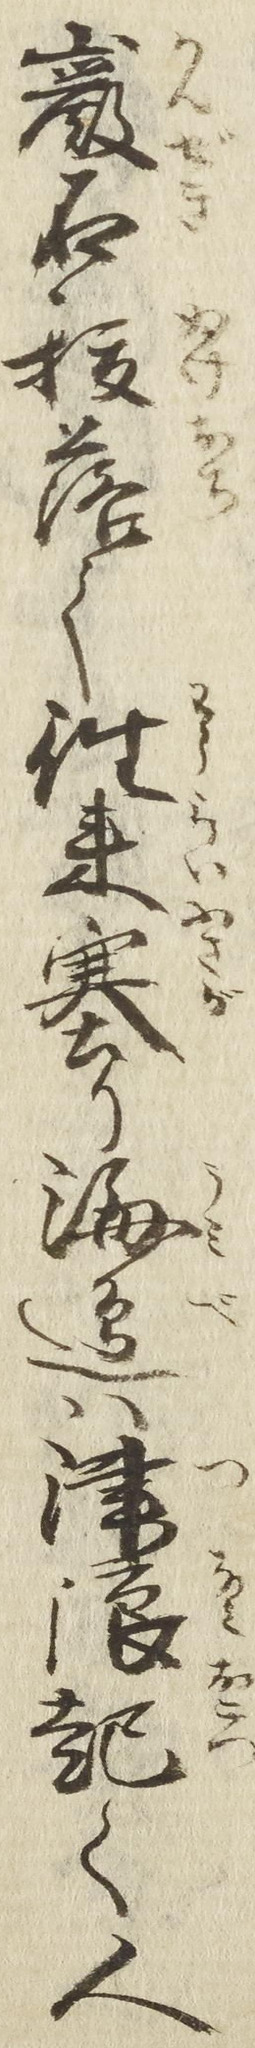巌石抜落て往来塞り海辺は津浪起て人

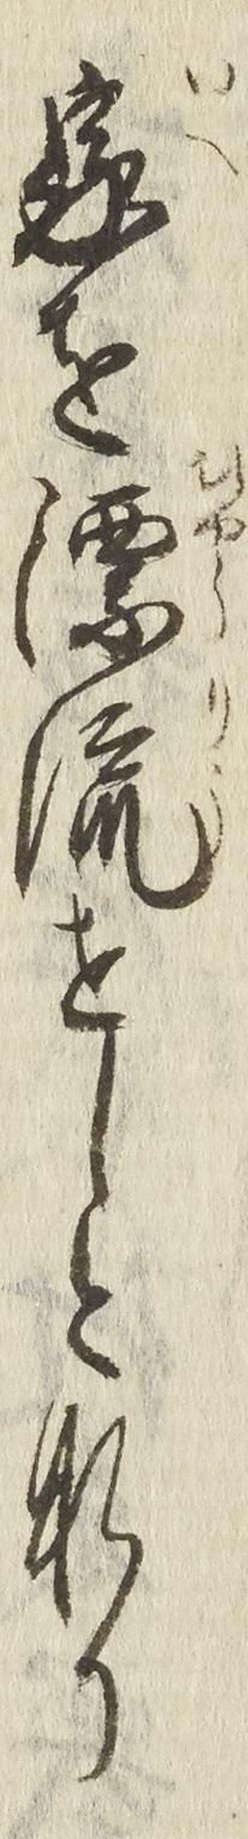家を漂流せしとなり
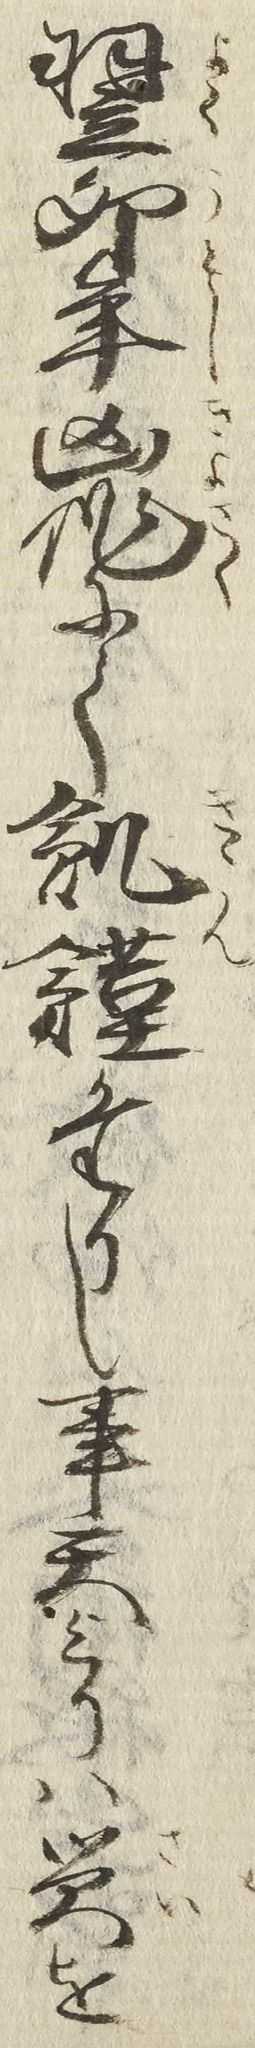翌卯年凶作にて飢饉たりし事天よりは災を
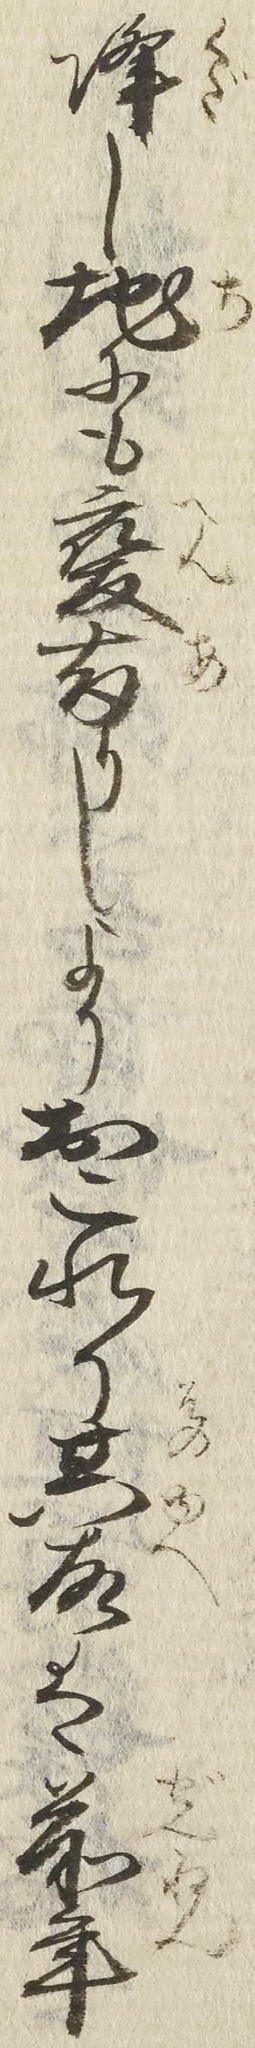降し地にも変有りしよりおこれり其故は前年
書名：天明奇畧　全
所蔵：東京大学地震研究所図書室 Earthquake Research Institute Library, The University of Tokyo, JAPAN
